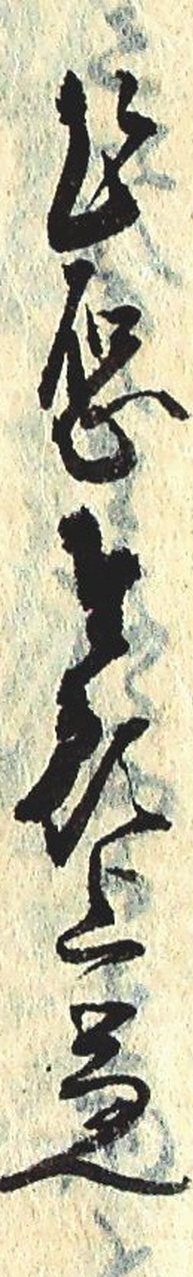乍恐奉願上覚
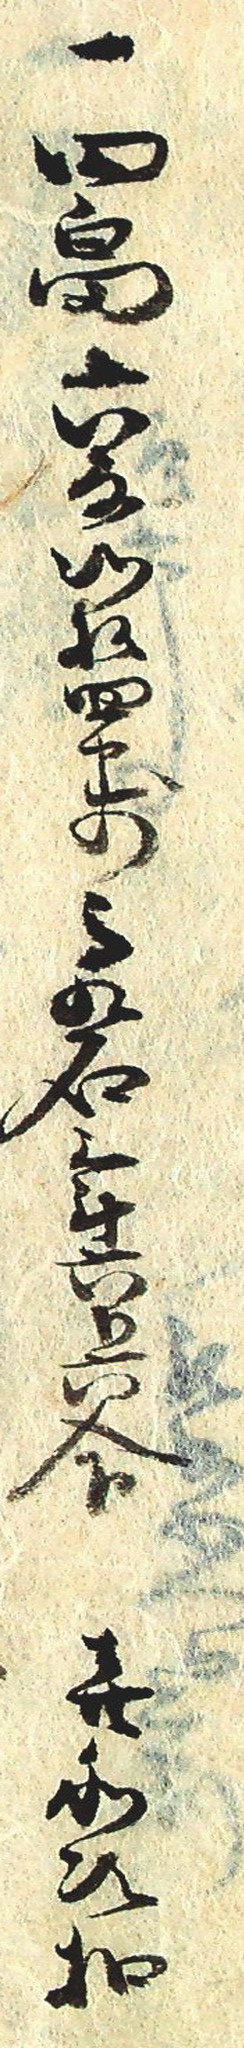一田畠六反弐拾四歩高九石三斗六升六合喜和次扣
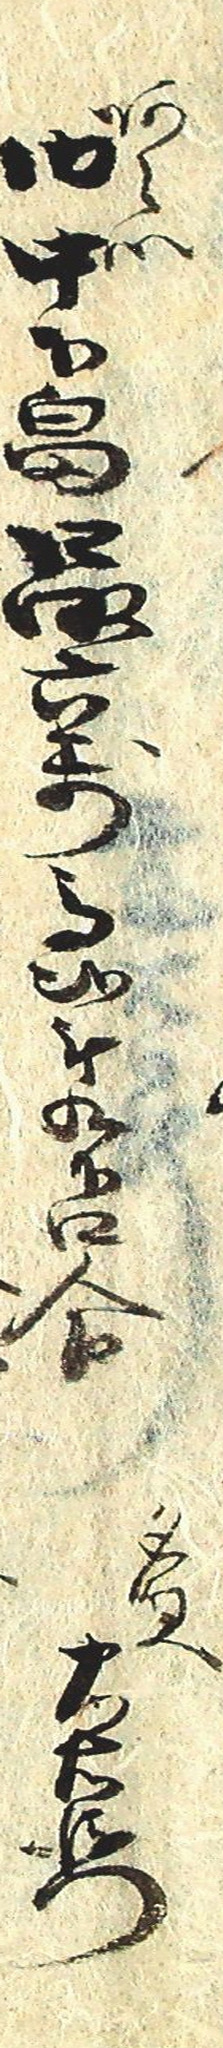内中下畠四畝六歩高弐斗九升四合忠右衛門
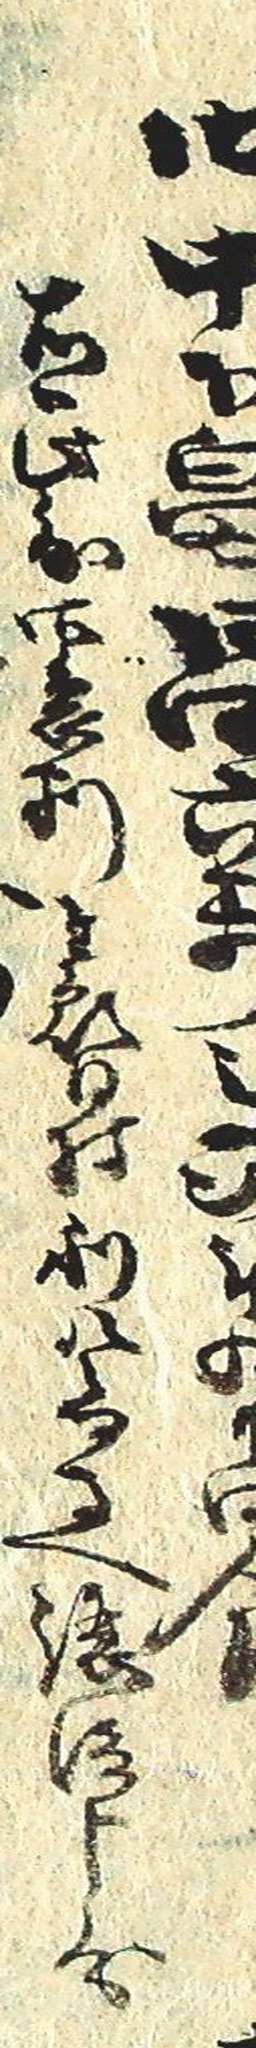右は此度御裏判奉願同村利八郎方へ譲渡申分
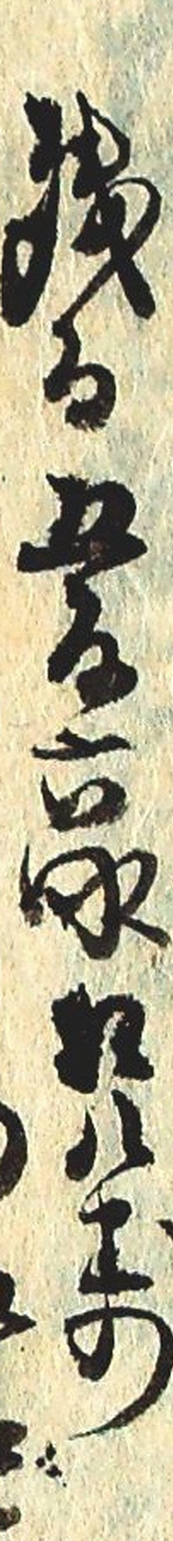残て五反六畝拾八歩
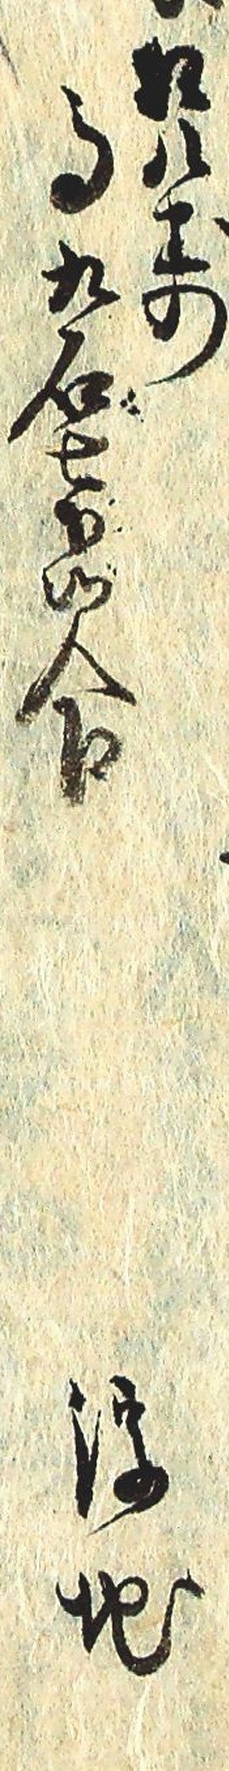高九石七升弐合浮地
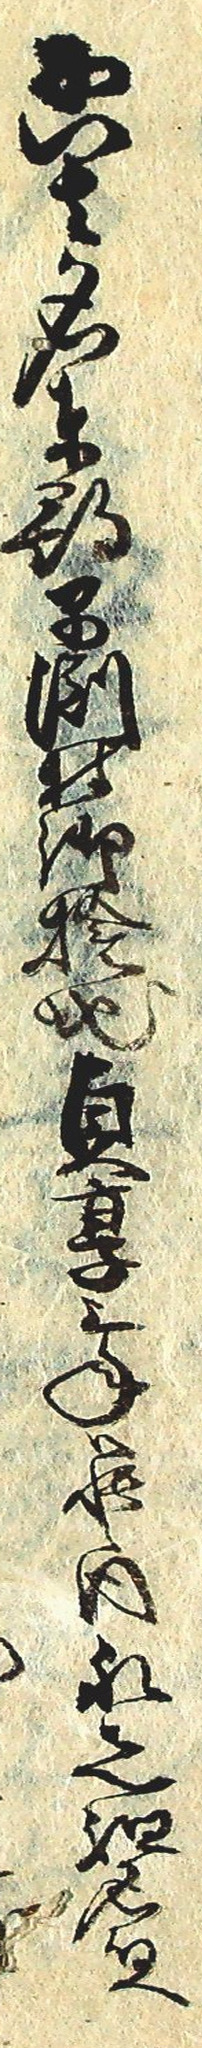右は名東郡早淵村御検地貞享三年御帳之内私先祖名負
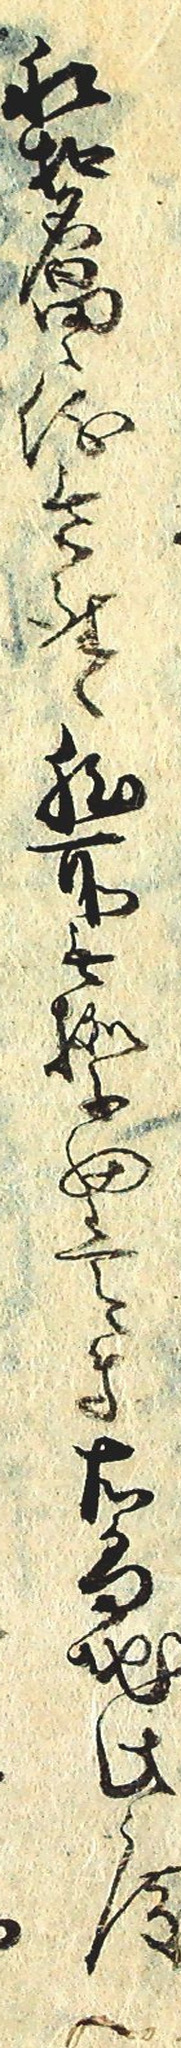私扣名畠に紛無御座候然所無拠子細有之に付右畠地此度
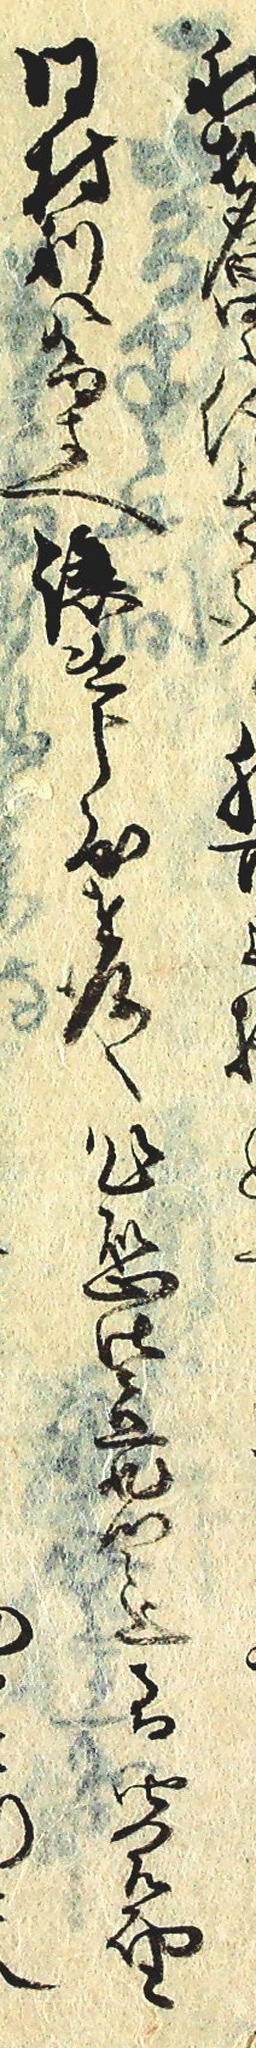同村利八郎方へ譲遣申度奉存候乍恐御慈悲之上被為聞召届
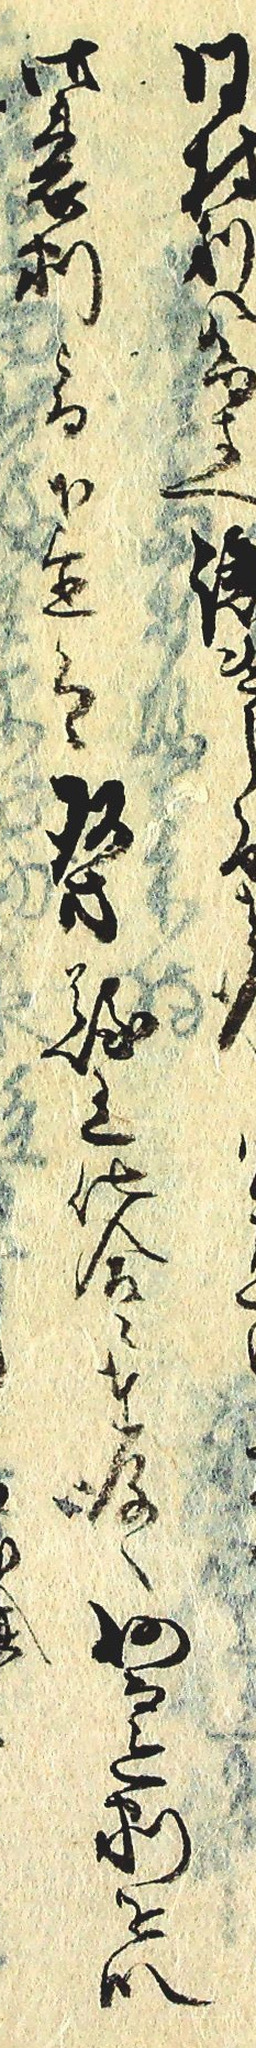御裏判被為下置候はゝ双方難有仕合に奉存候仍て連判を以
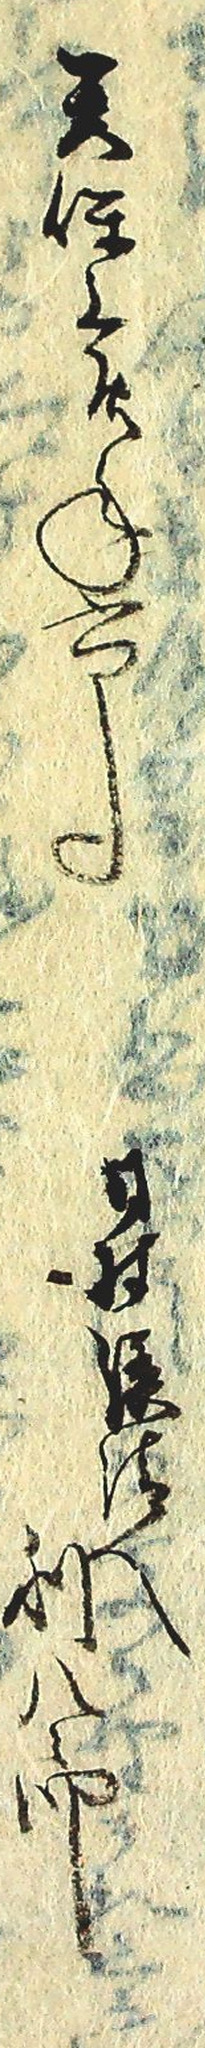天保三辰年六月同村譲請人
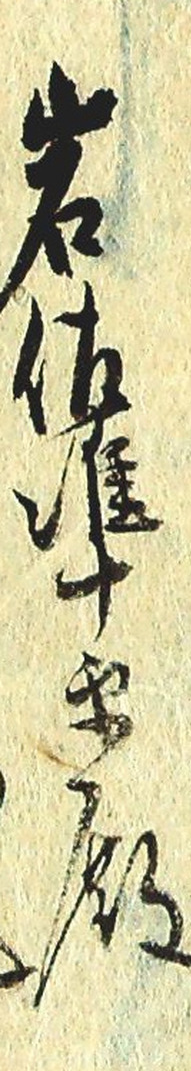岩佐準平殿
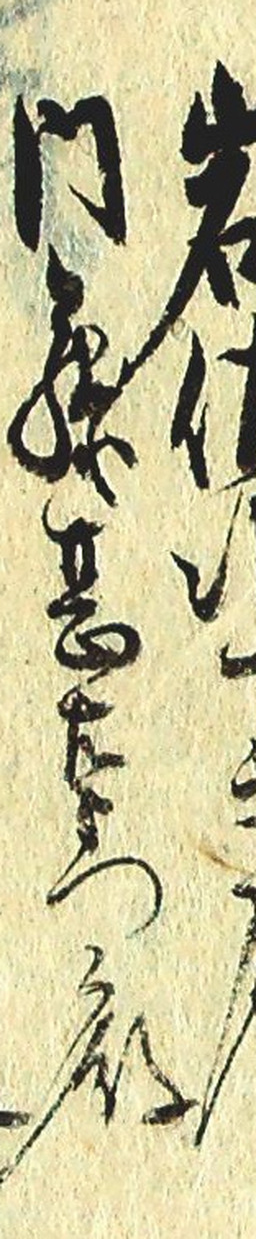内藤甚右衛門殿
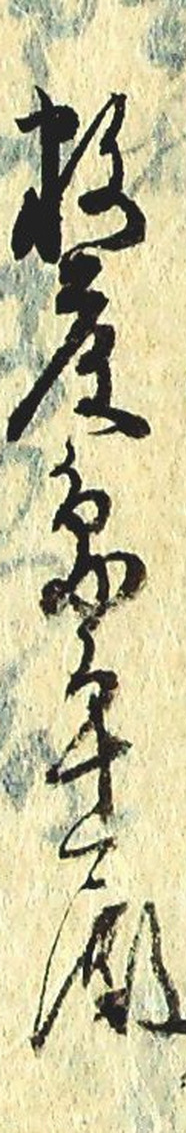数藤円平殿
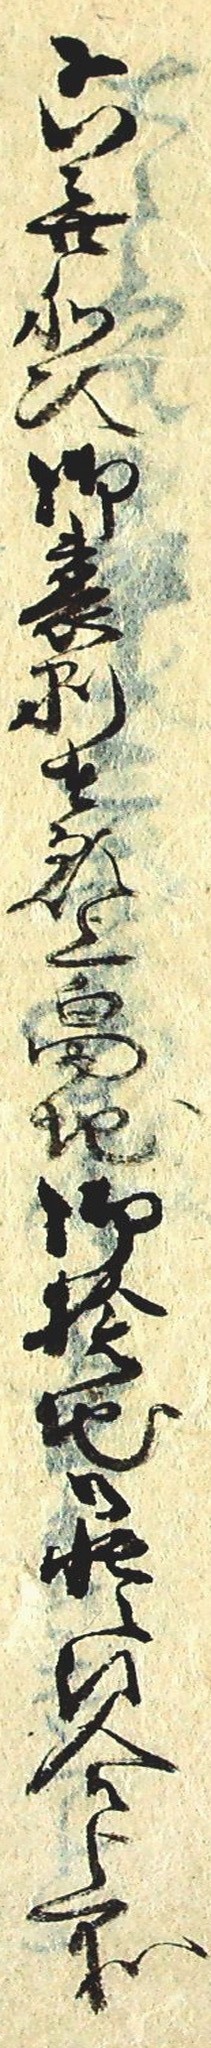右喜和次御裏判奉願上畠地御検地御帳に引合申所
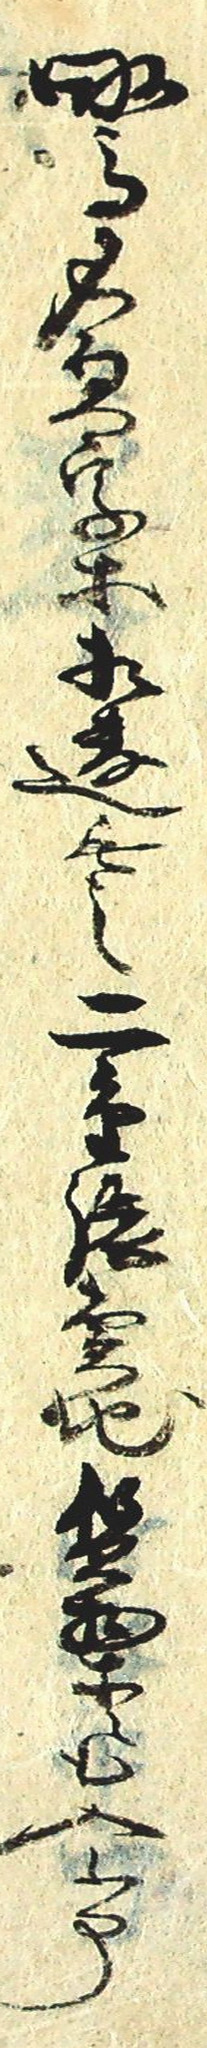畝高名負字等相違無之二重譲売地質物等にも入不申
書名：諸御願書控(弐番）
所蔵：鳴門教育大学 Naruto University of Education
